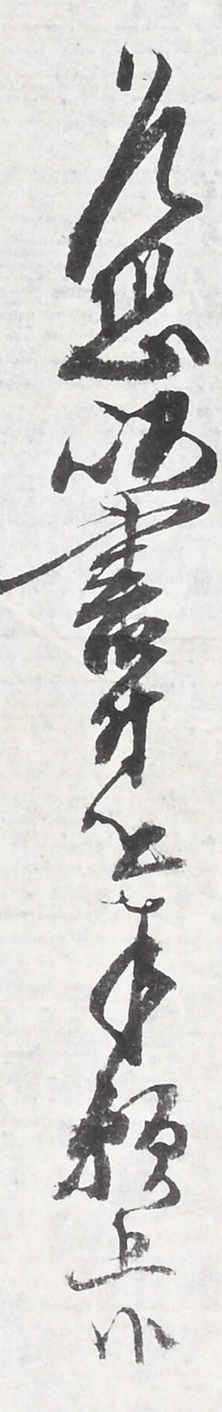乍恐以書付を奉願上候
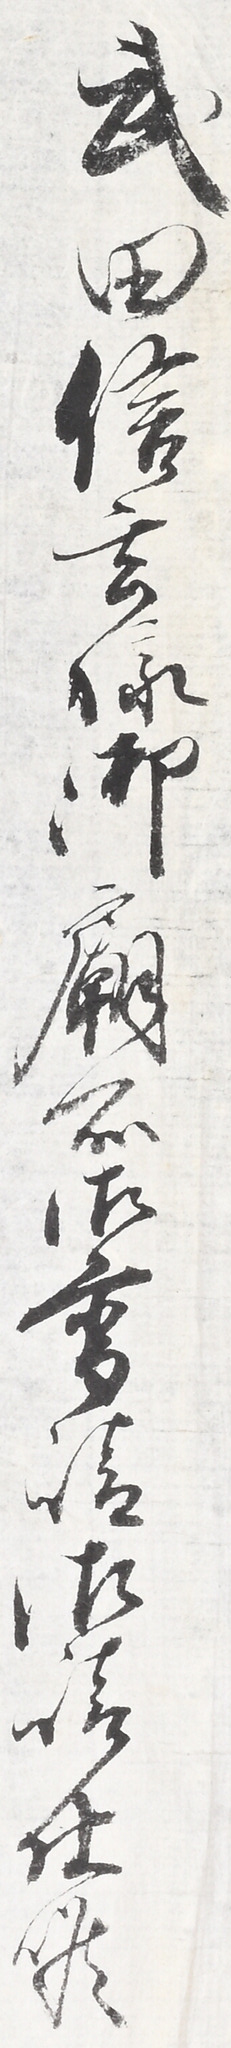武田信玄様御廟所御普請御請仕候
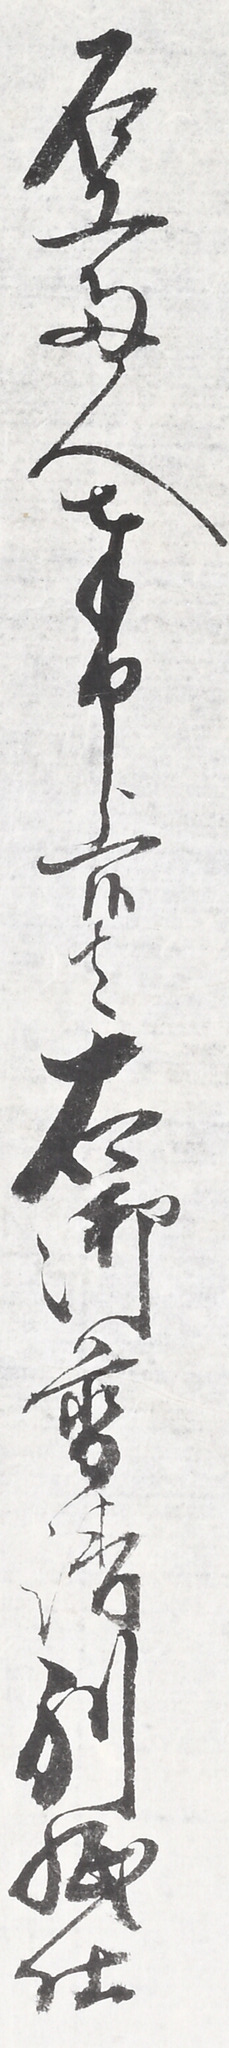石工両人奉申上候は右御普請別紙仕
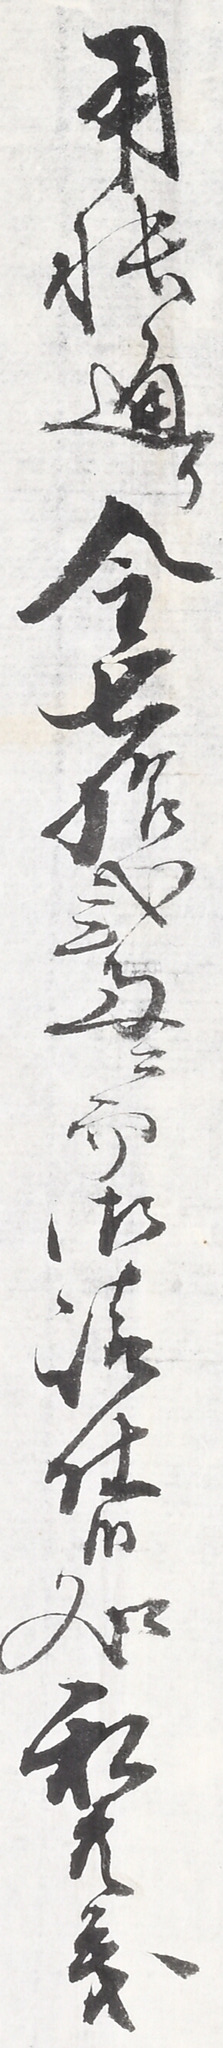用帳通り金七拾弐両にて御請仕候処私共義
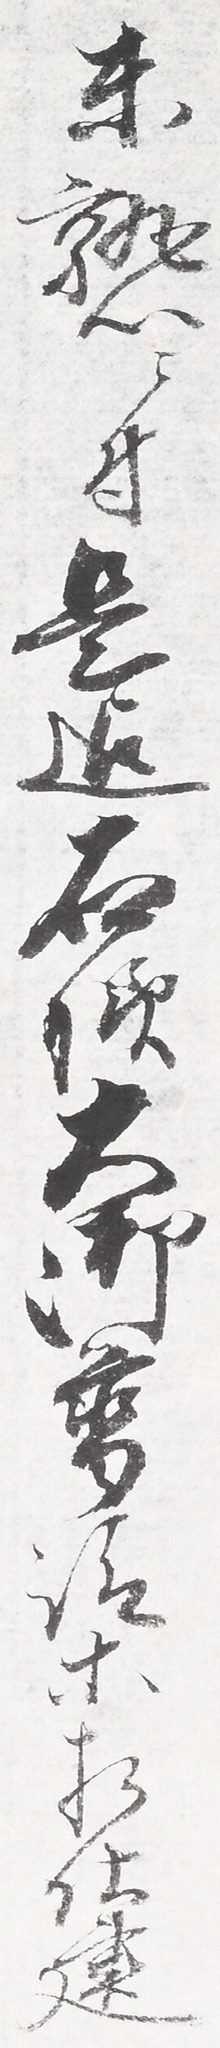未熟に付是迄右様大御普請等相仕建
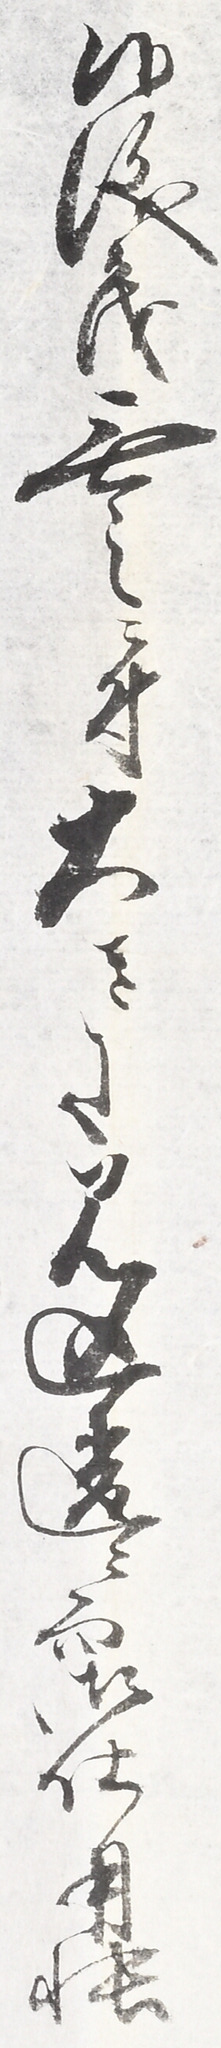候儀も無之に付大きに見込違にて御仕用帳
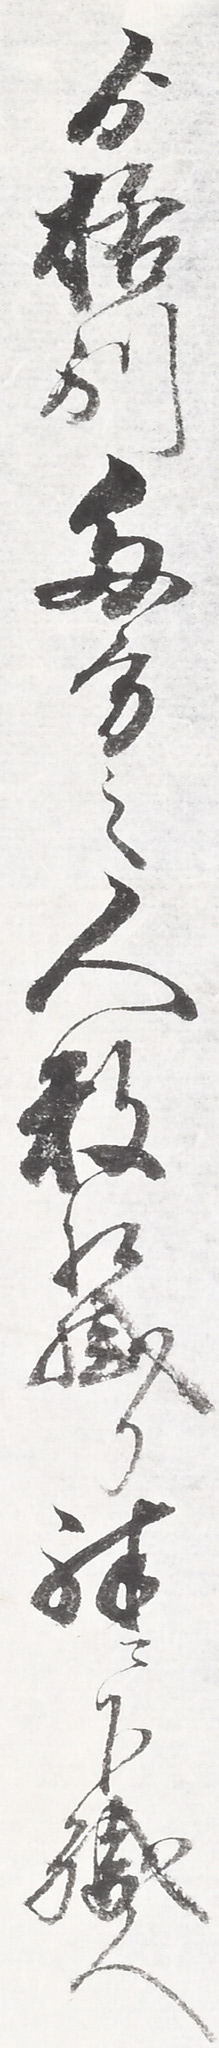ゟ格別多分之人数相掛り殊に下職人
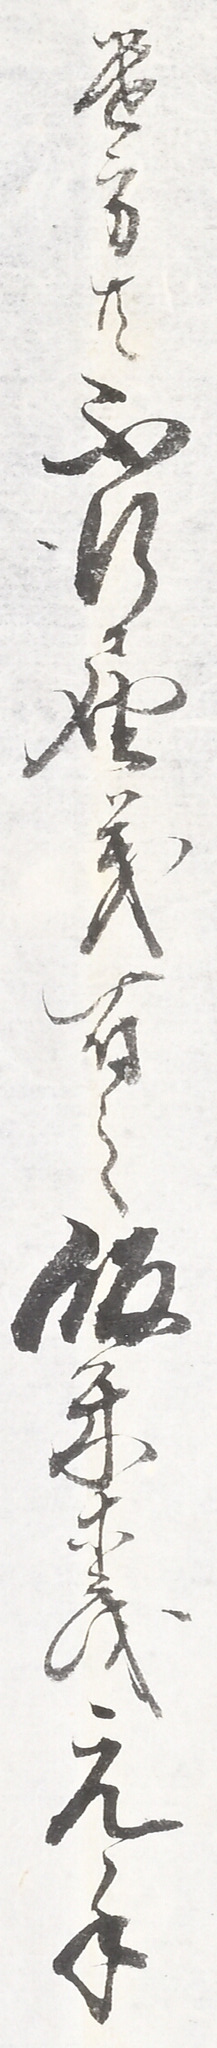遣方共不行届義有之飯米等も元手
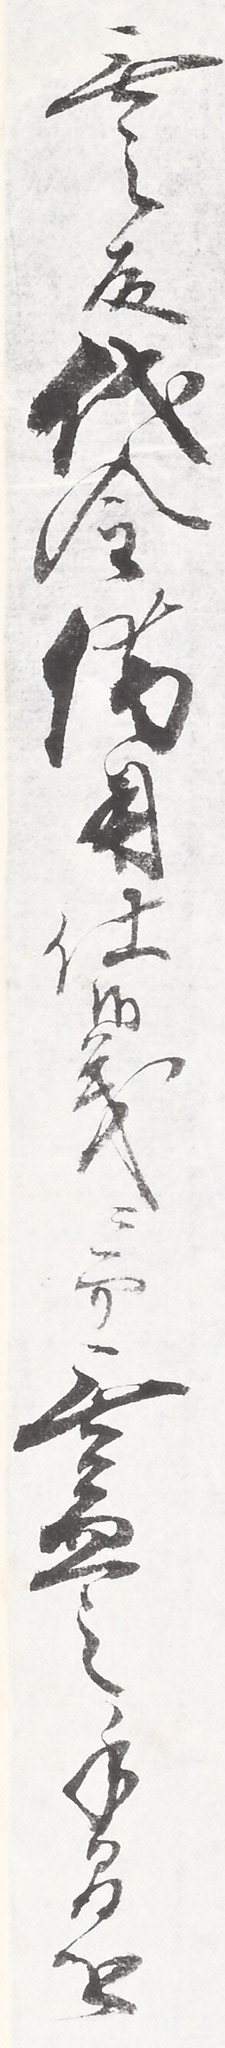無之故代金借用仕候義にて無益之手間を
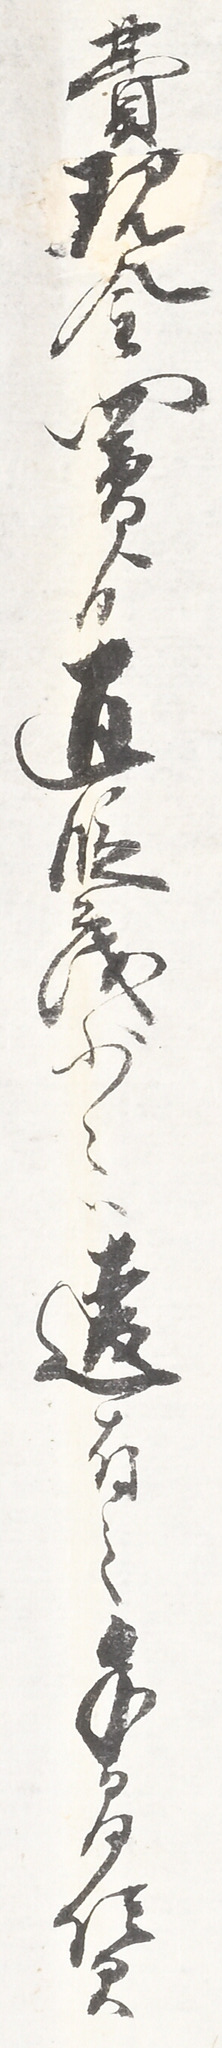費現金買ゟ直段も少々は違有之手間賃
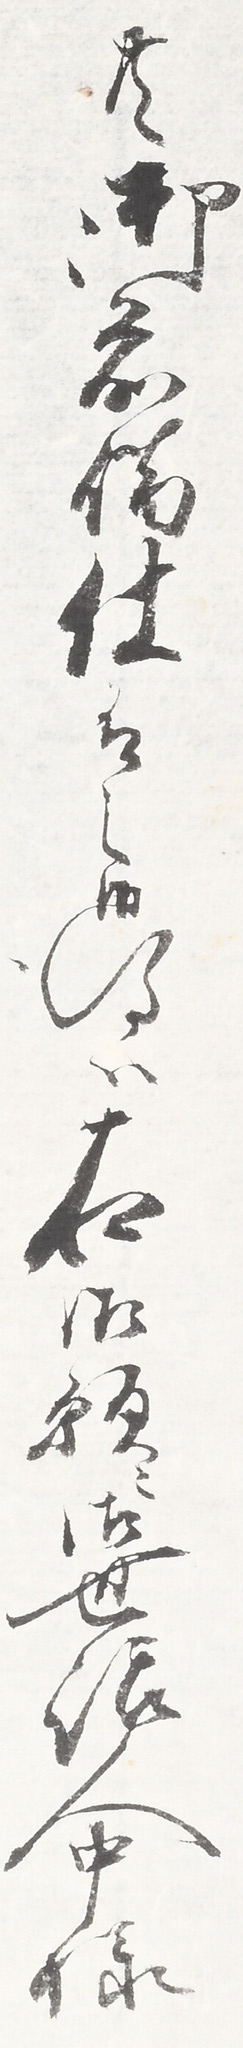共御前借仕有之候得は右御願に御世話人中様
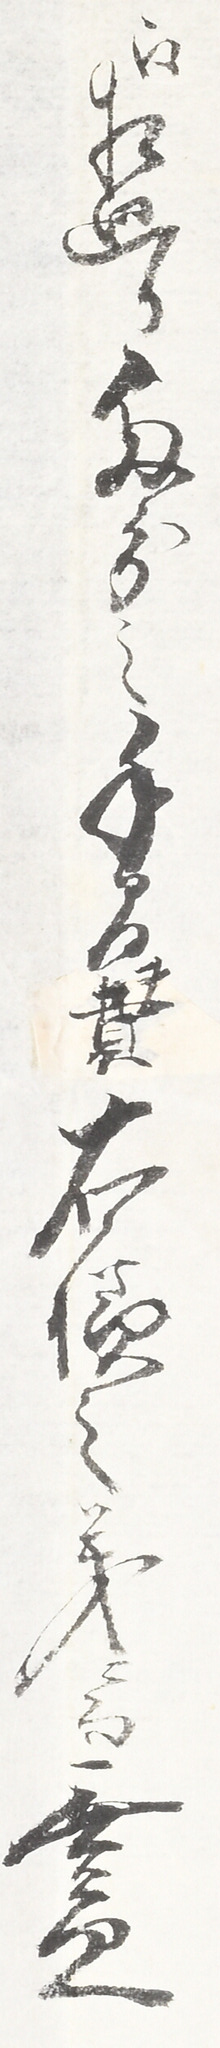え相廻り多分之手間を費右様之義にて無益
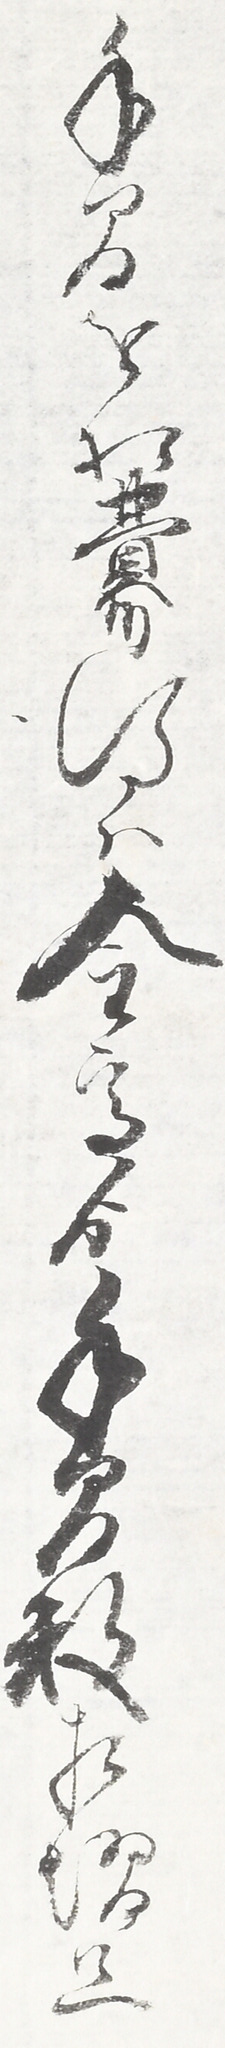手間を相費候得は金高ゟ手間数相増且
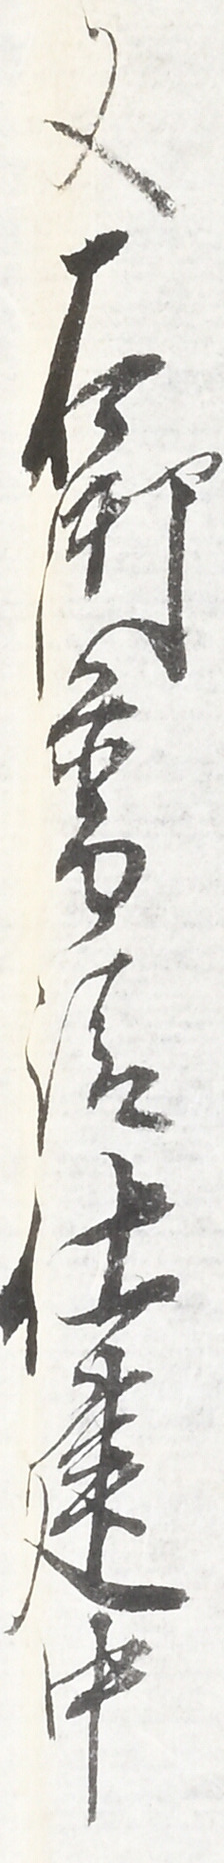又右御普請仕建中
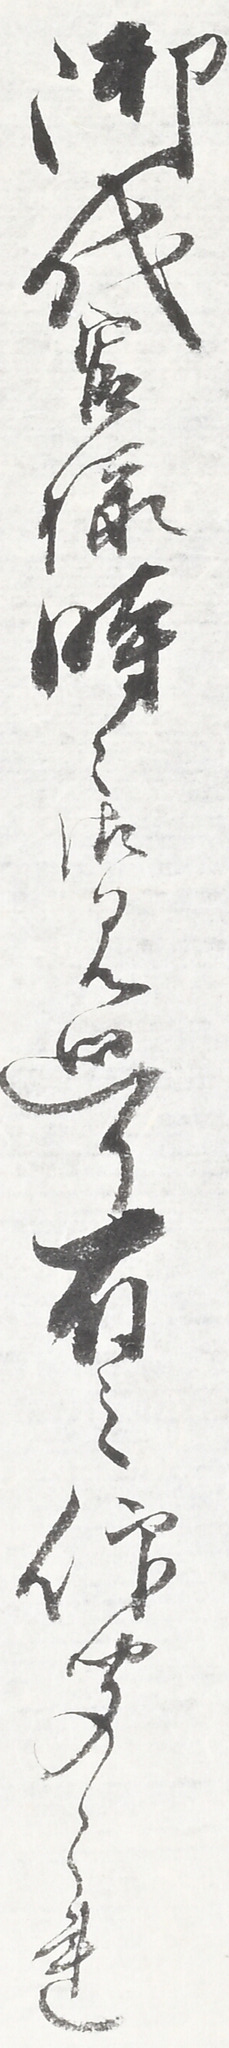御代官様時々御見廻り有之仰聞られ
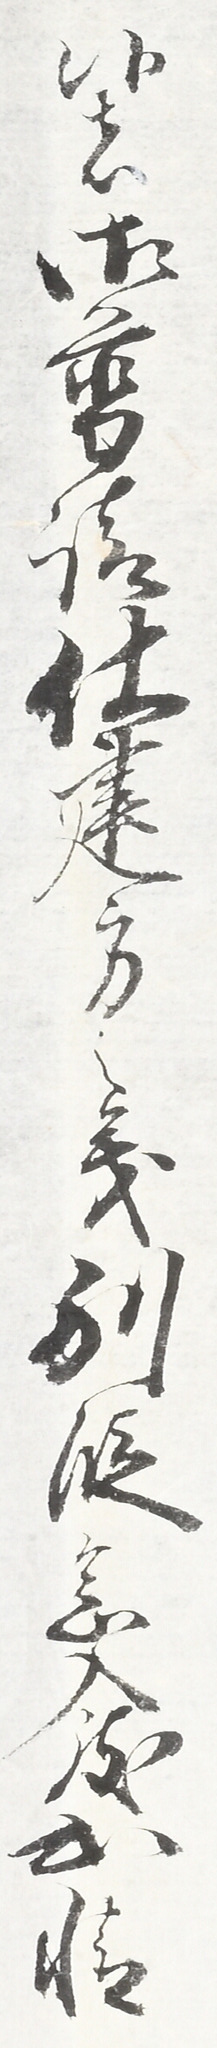候は御普請仕建方之義別段念入致出情
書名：乍恐以書付を奉願上候
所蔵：伊那市立高遠町図書館・合同会社AMANE
